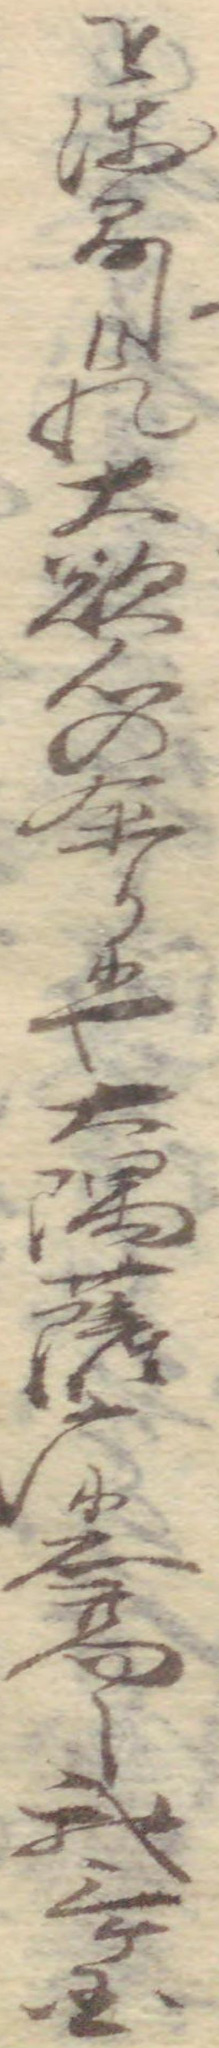も浅間しけれ大欲心の余りにや大隅薩摩に発向し我三ケ国
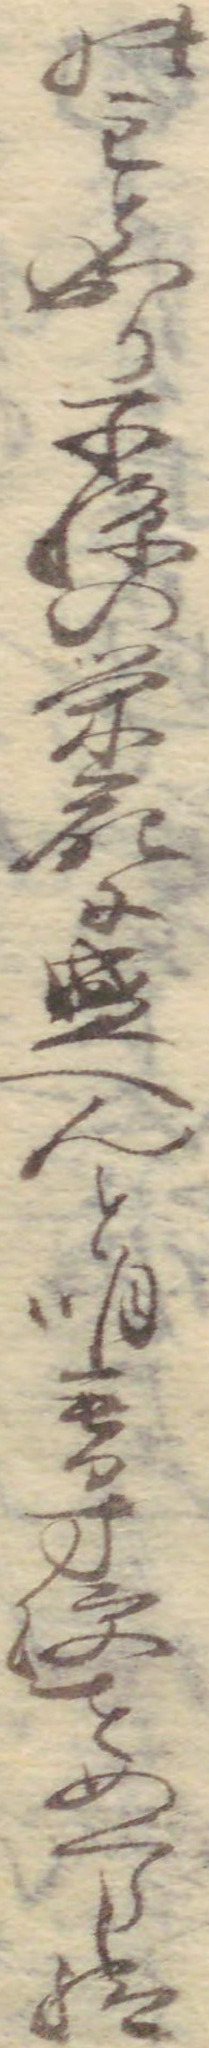の主と成り子孫の栄花に盛へんと明暮方便をめくらし給
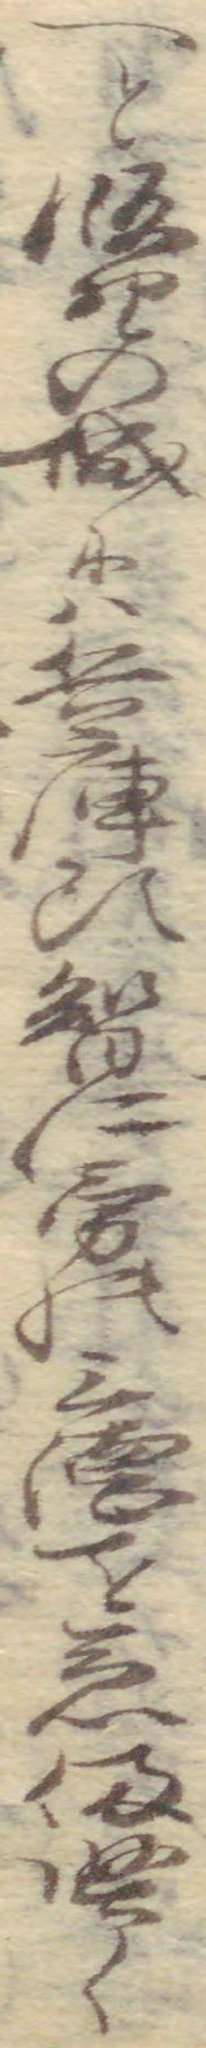へと飯野の城には兵庫頭智仁勇の三徳を兼備堅く
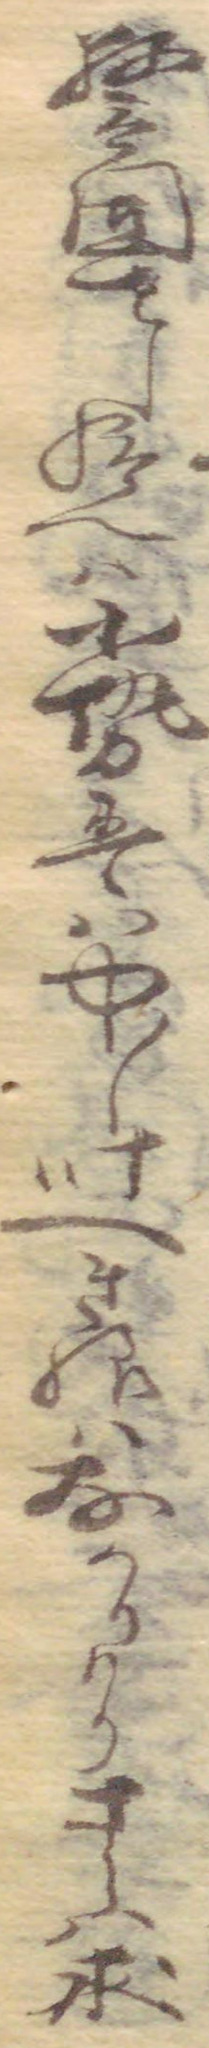警固をし給へは小勢にては中々叶へき様はなかりけりさらは求

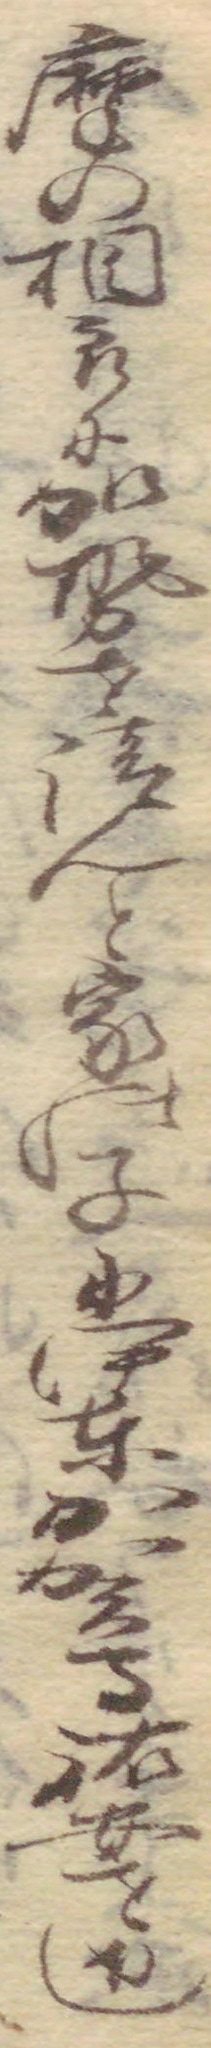摩の相良に加勢を請んと家の子に伊東加賀守祐安を近
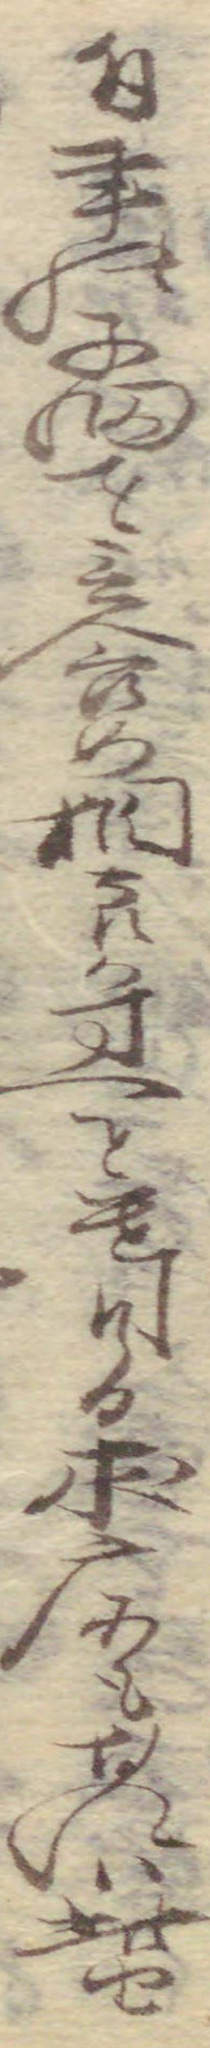付事の子細を言含め相良か方へと遣しける求摩にもなれは此由
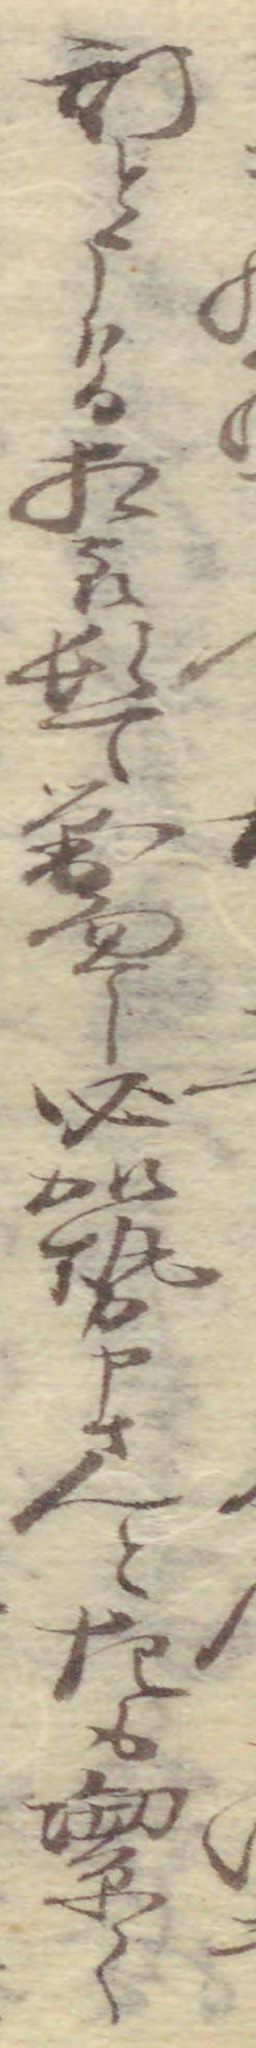斯と申ける相良頓て対面し必加勢申さんと左も御早く
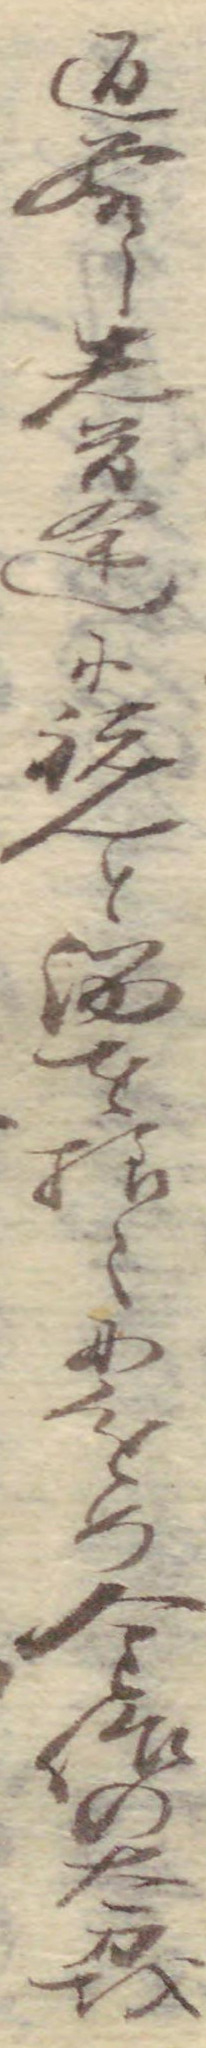返答し先首途に祝んと酒を様々に進め金作の太刀を
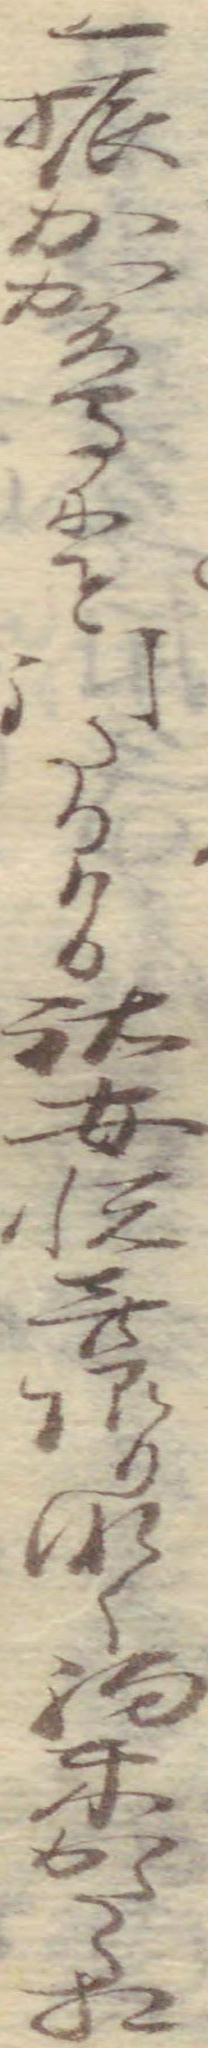一振加賀守にそ引たりける祐安悦喜限りなく約束かたく相
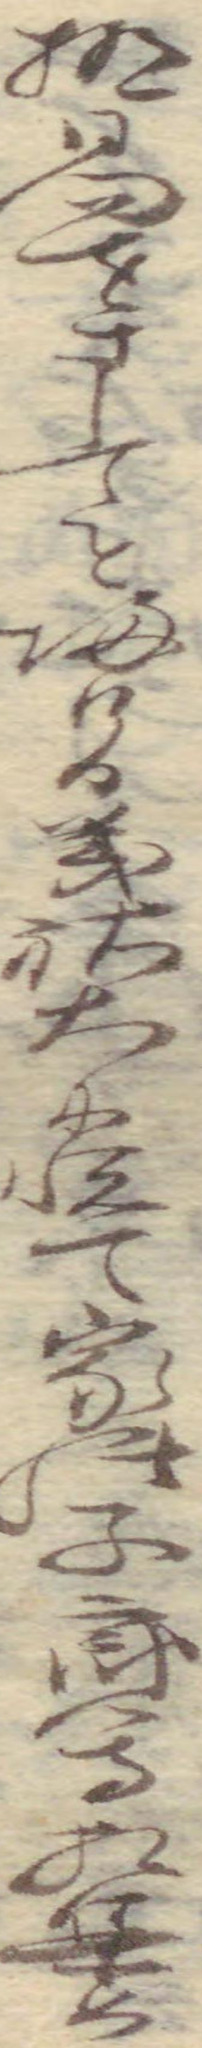極日向をさしてそ帰ける義祐大に悦て家の子郎等相集め
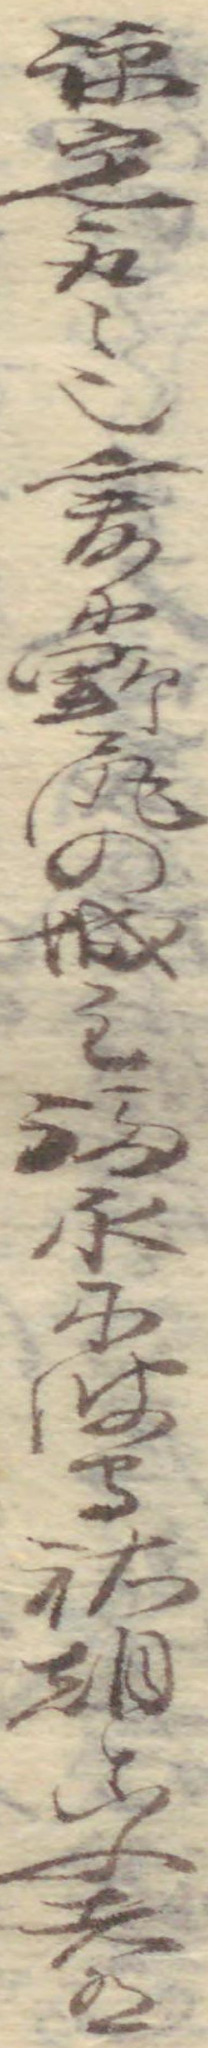評定取々也爰に野尻の城主福永丹波守祐朝といふ者有
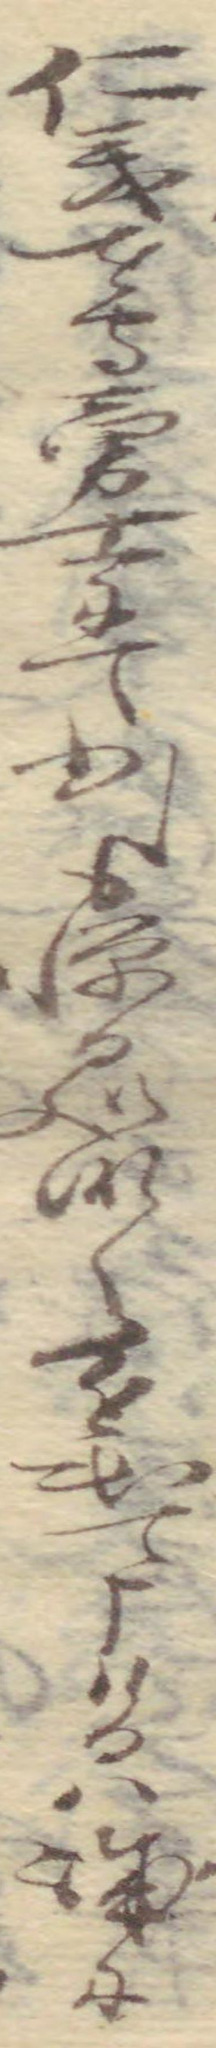仁義を守勇士にて少しも憚る処なく進出て申けるは誠に
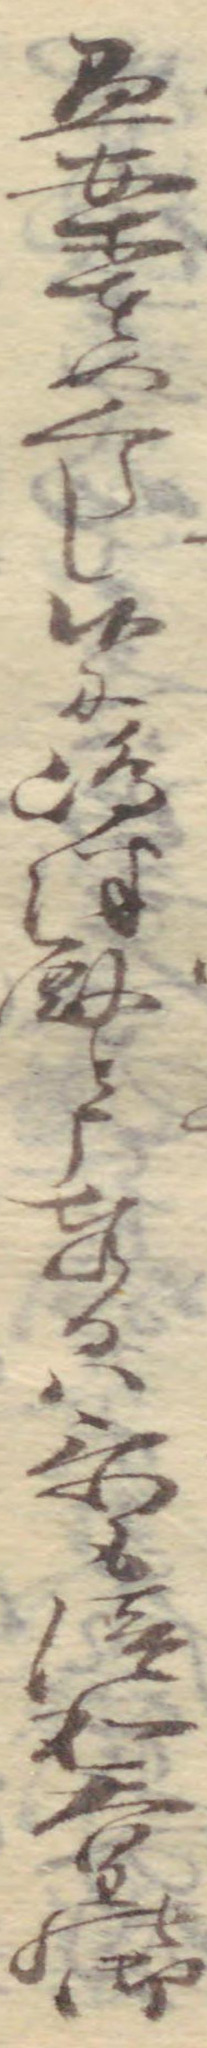愚案をめくらし候に嶋津殿と申奉るは忝も清和天皇の御
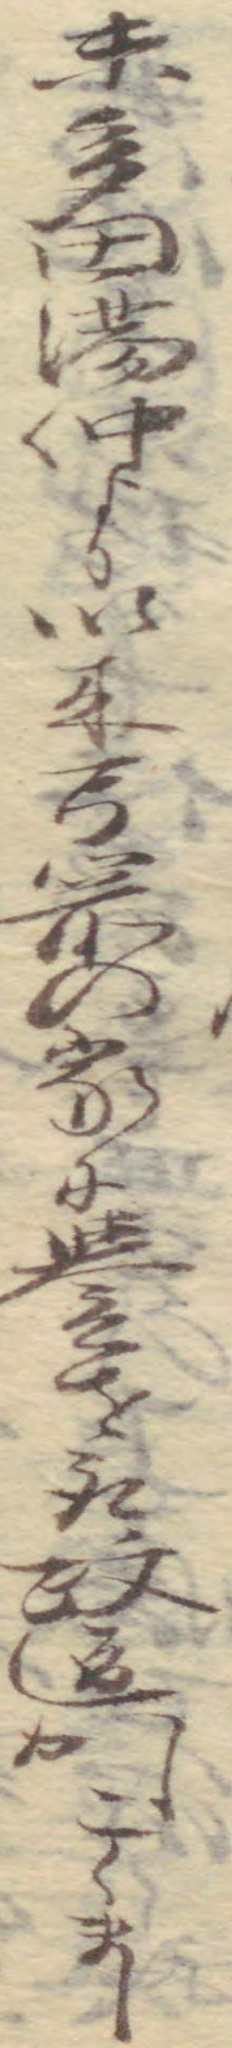末多田満仲より以来弓箭の家に誉を取政道かしこくまし
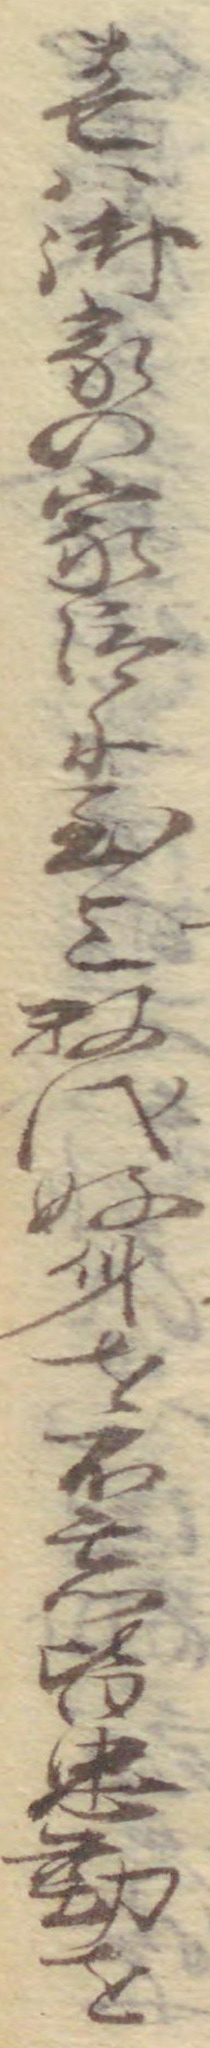ませは御家の家臣に至迄数代好身を不忘皆忠勤を
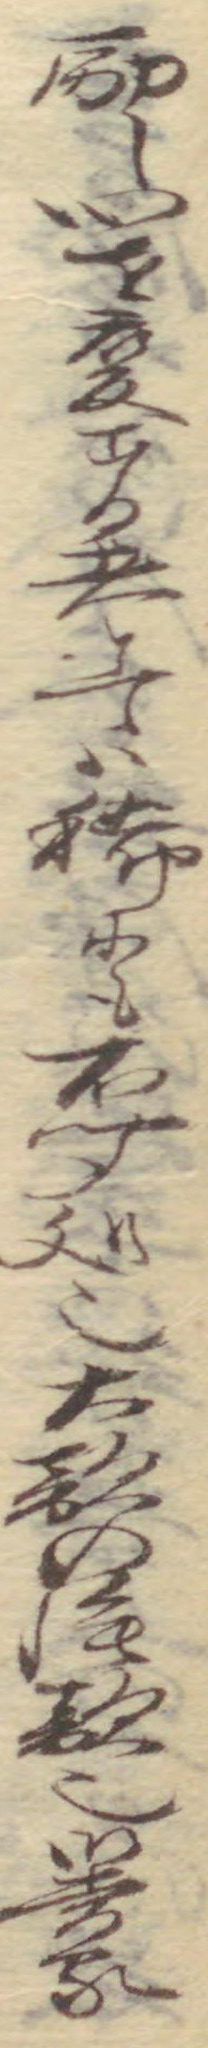励し心を変さる者とては稀にも不聞処也大敵の強敵也御当家
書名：鶯宿雑記. 巻199-200
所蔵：国立国会図書館 National Diet Library, JAPAN
